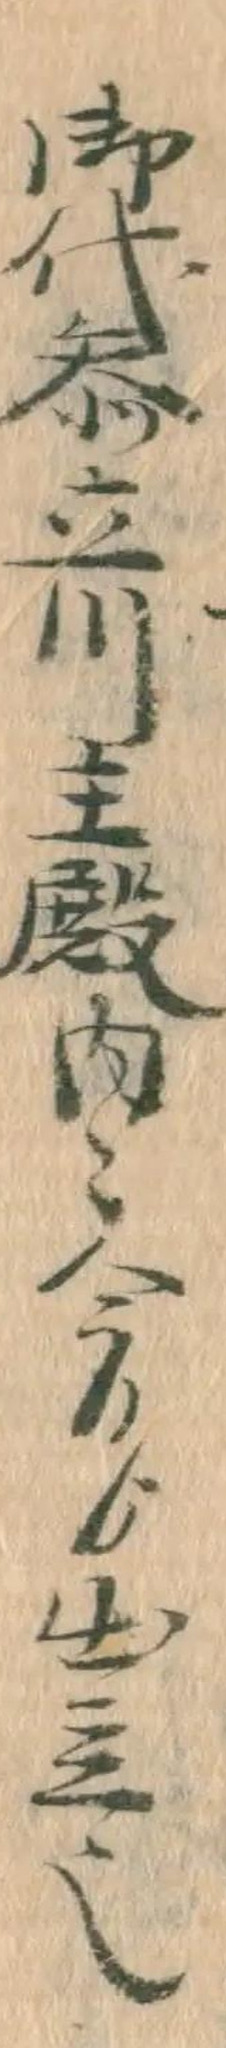御代参立川主殿内々今日ゟ出立也
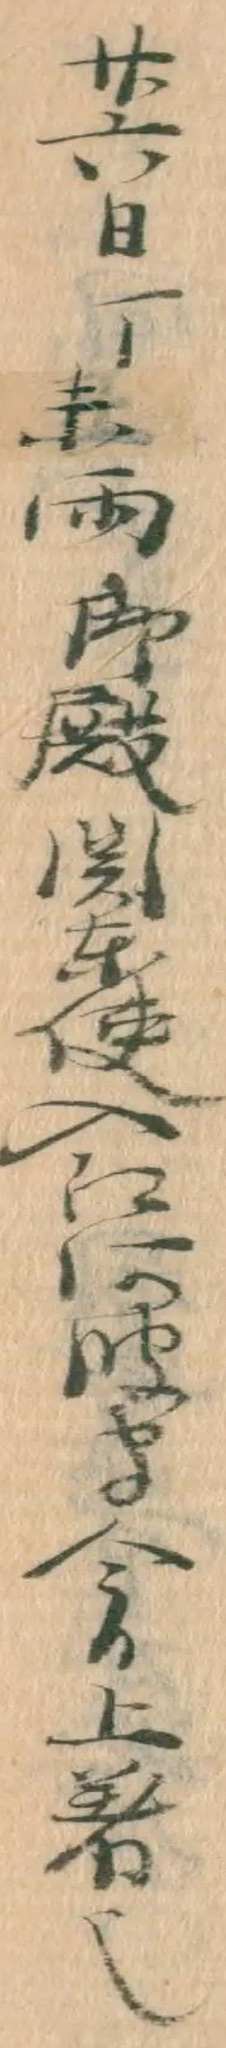廿六日丁未雨御殿関東使入江河波守今日上着也
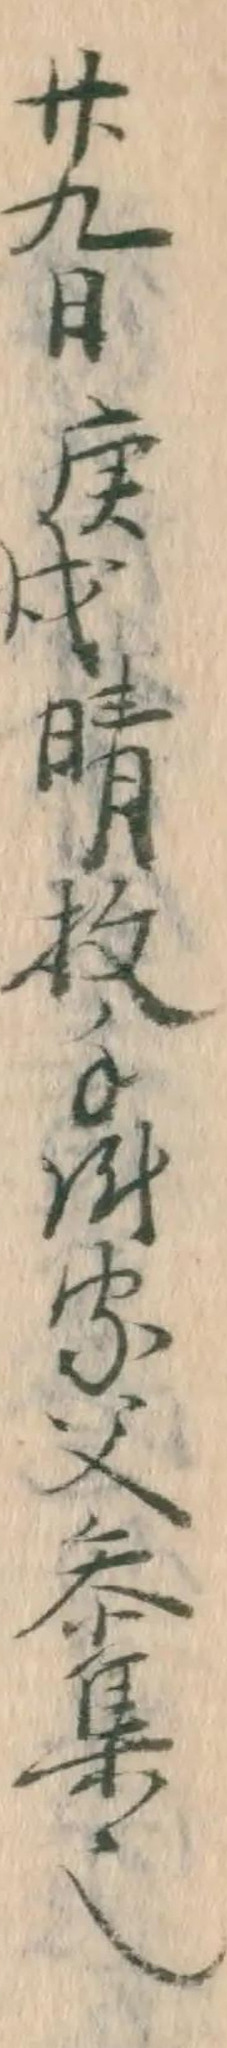廿九日庚戌晴枚手掛家父参集也
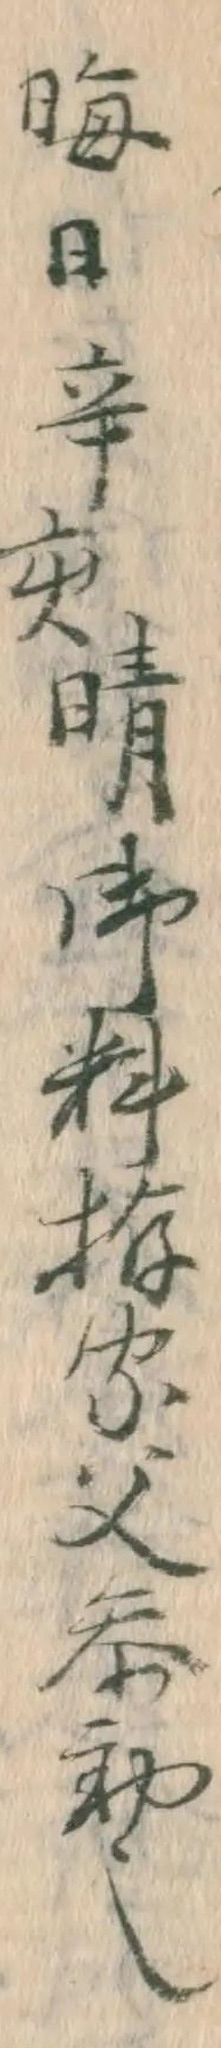晦日辛亥晴御料拵家父参勤也
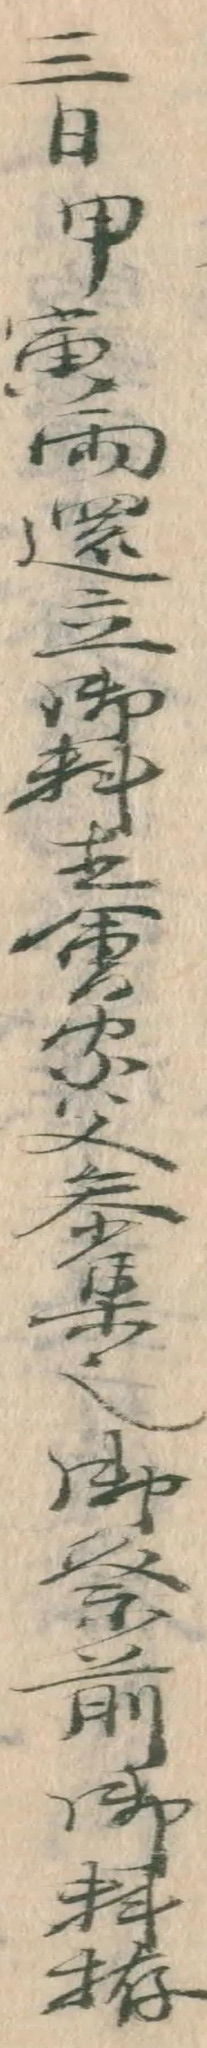三日甲寅雨還立御料直會家父参集也御祭前御料拵
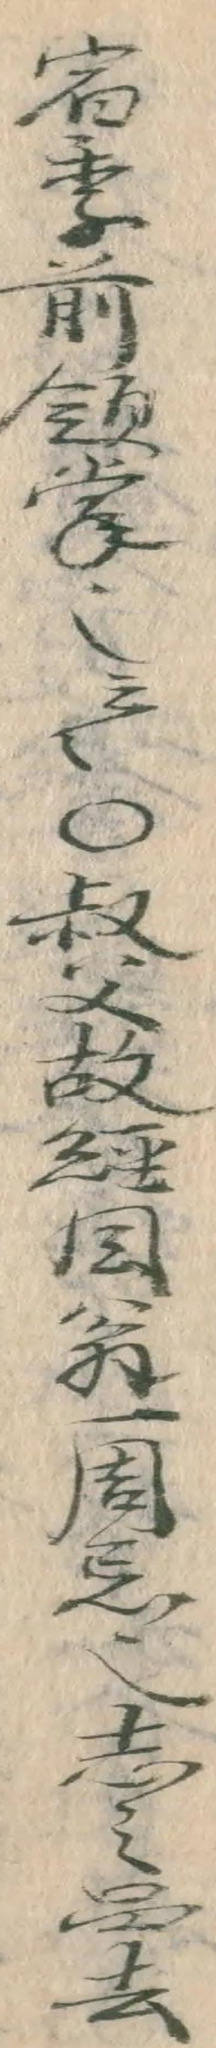宿季前領掌也云々〇叔父故経岡翁一周忌也志之品去
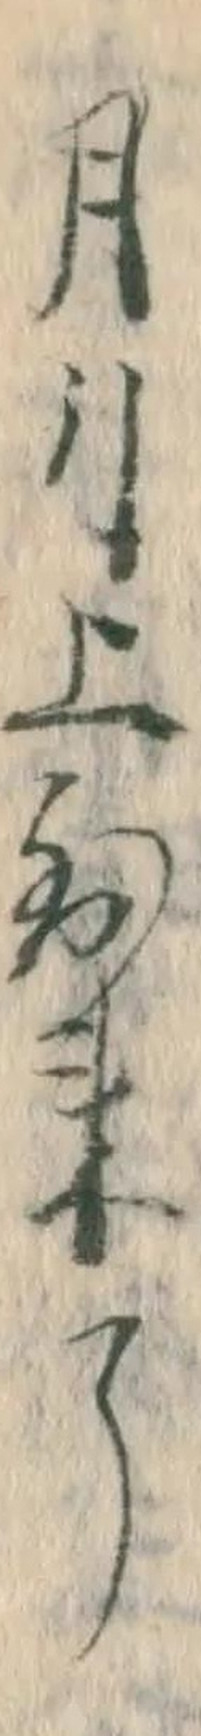月引上到来了
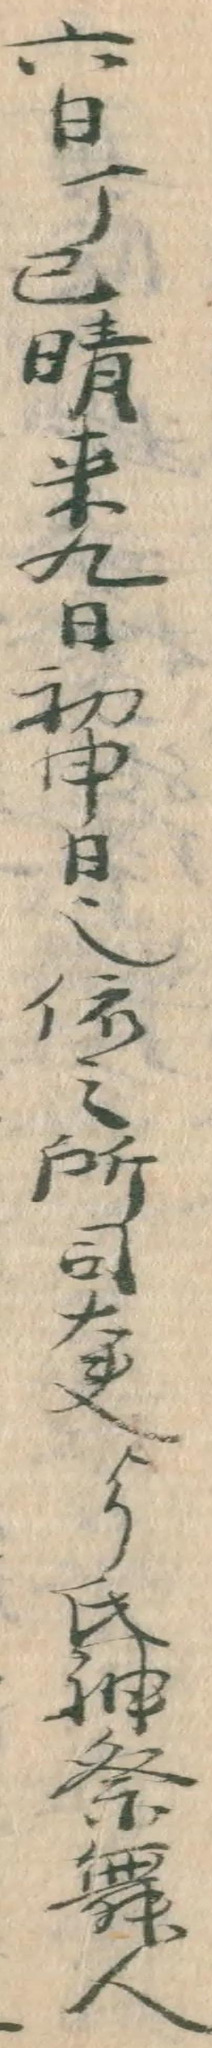六日丁巳晴来九日初申日也依之所司大夫より氏神祭舞人
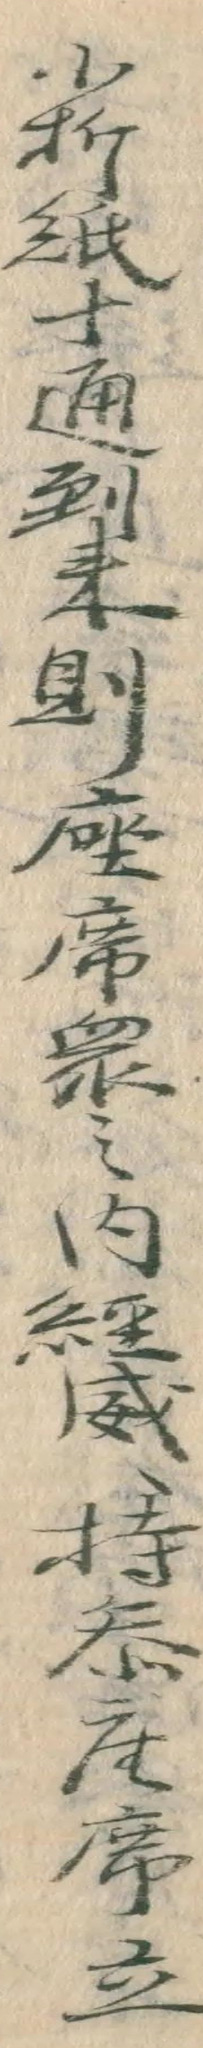小折紙十通到来則座席衆之内経威へ持参座席立
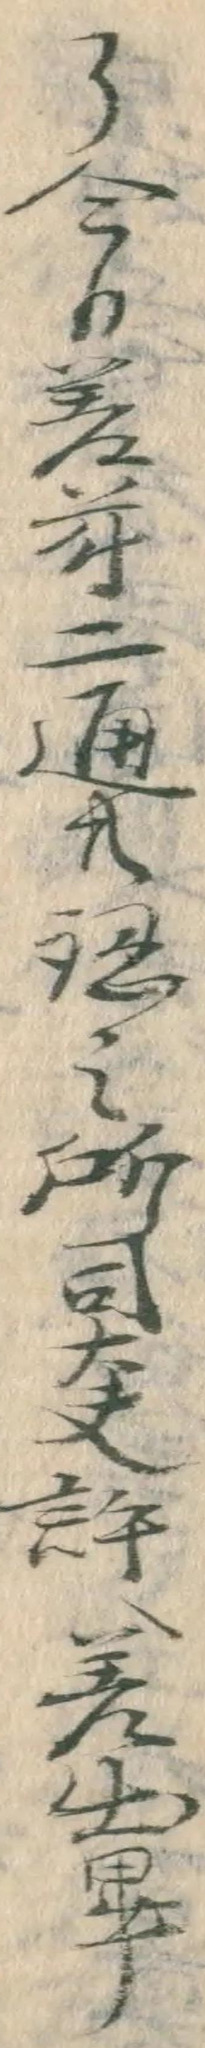了今日差符二通共認之所司大夫許へ差出畢
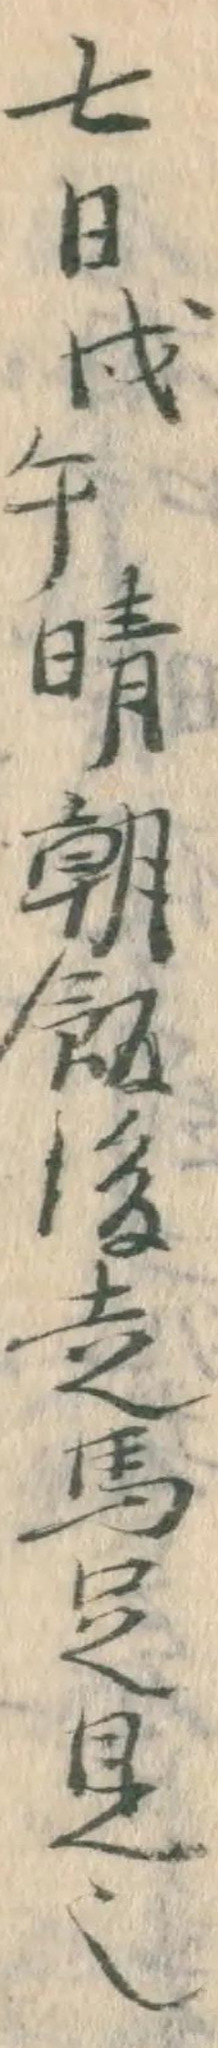七日戊午晴朝飯後走馬足見也
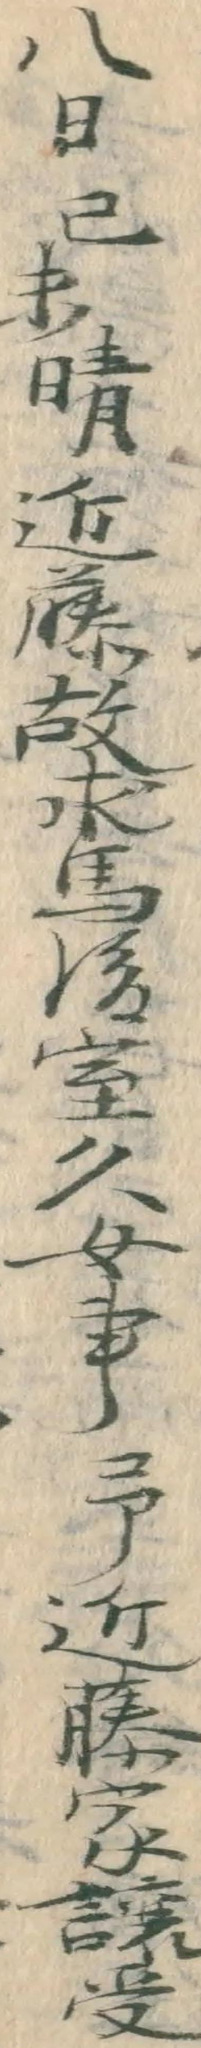八日己未晴近藤故求馬後室久女事予近藤家譲受
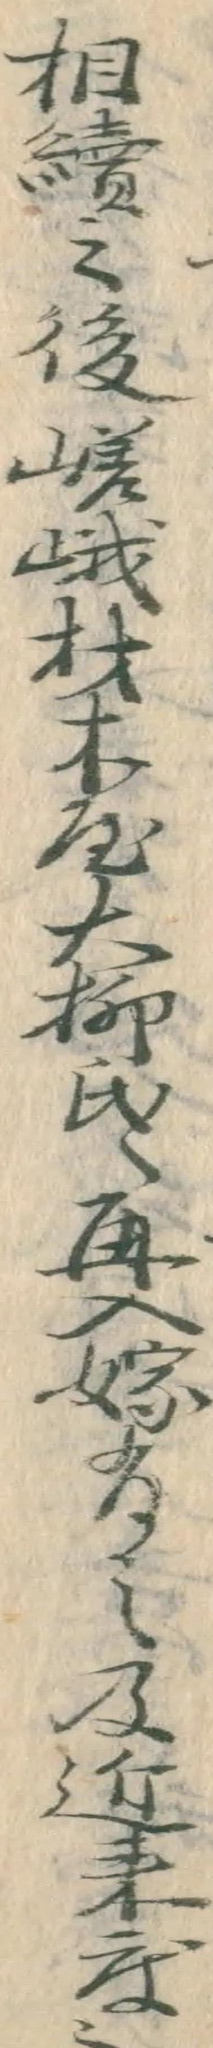相續之後嵯峨材木屋大柳氏へ再入嫁有之及近来度々

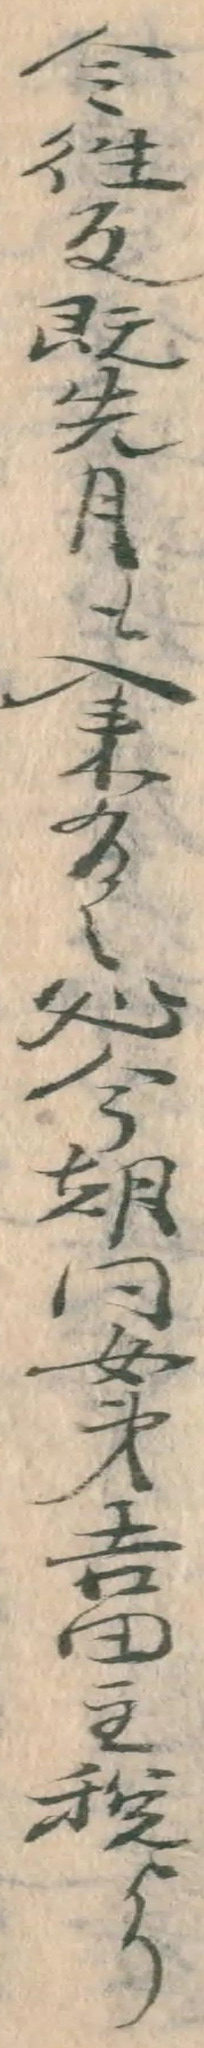令往反既先月も入来有之処今朝同女弟吉田主税より
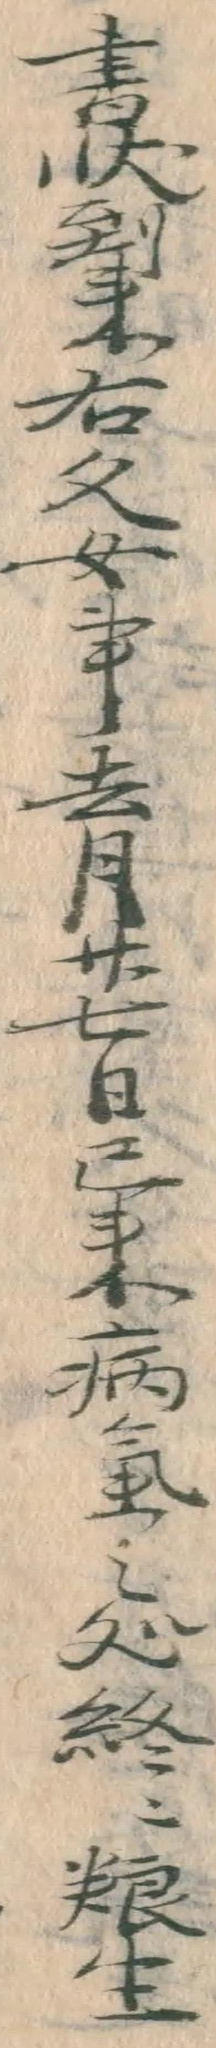書状到来右久女事去月廿七日已来病氣之処終に養生
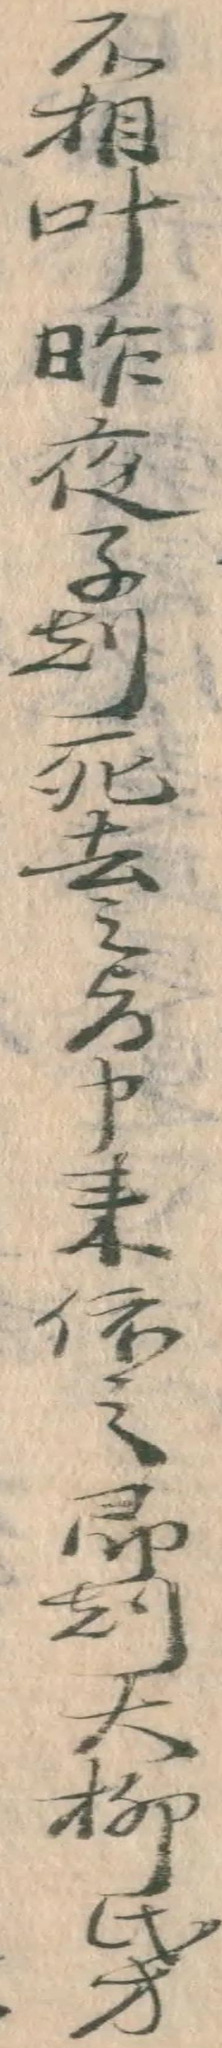不相叶昨夜子刻死去之旨申来依之即刻大柳氏方
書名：賀茂社記録. 第65冊
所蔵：国立国会図書館 National Diet Library, JAPAN
